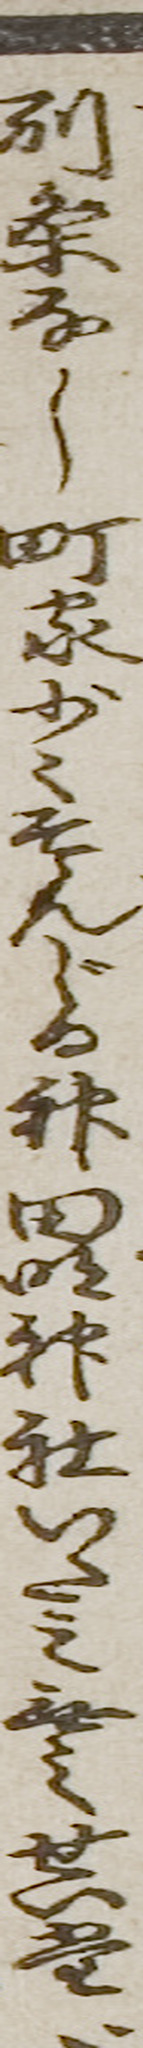別条なし町家少々そんじる神田明神社いたみ無之せい堂
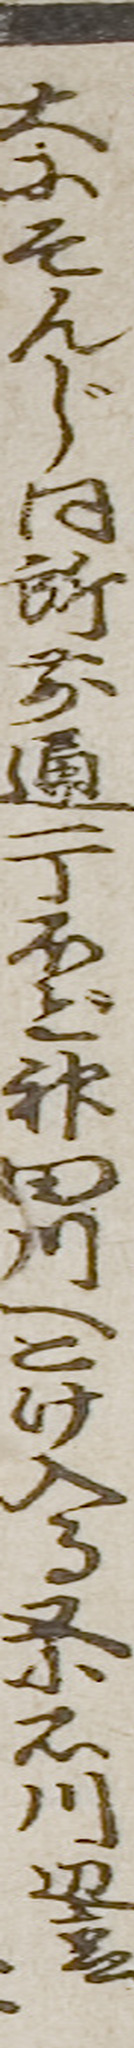大にそんじ同所前通一丁ほど神田川へこけ入る又小石川辺春
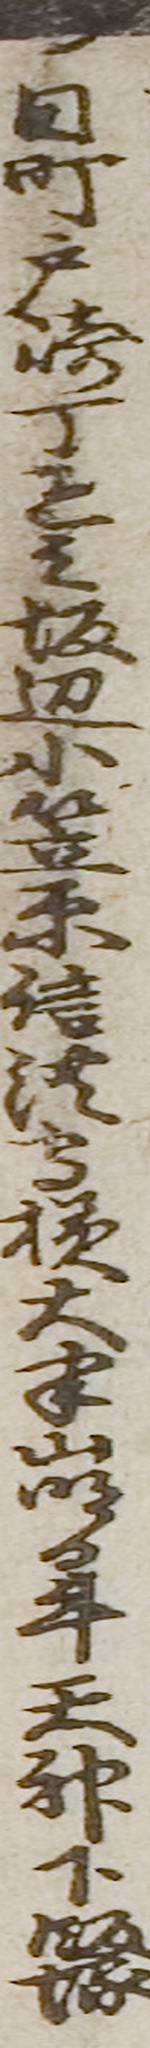日町戸崎丁とみ坂辺小笠原信濃守様大半崩る牛天神下飯塚
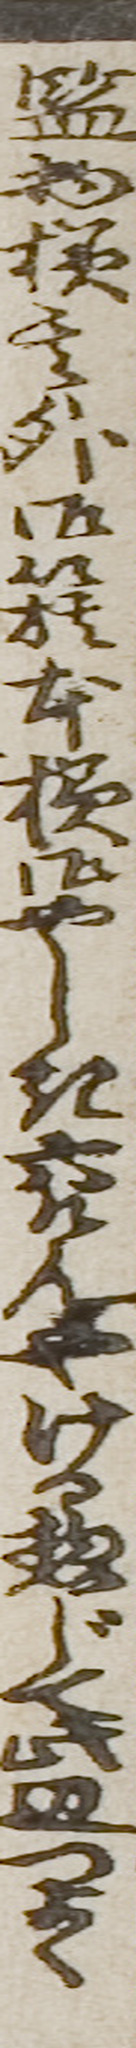監物様其外御旗本様御やしき六けんやける惣じて此辺つよく
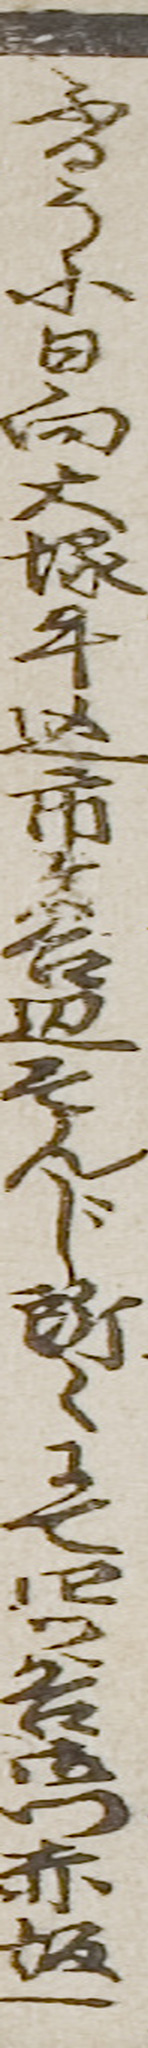ふるう小日向大塚牛込市ケ谷辺そんじ所々にて四ツ谷御門赤坂
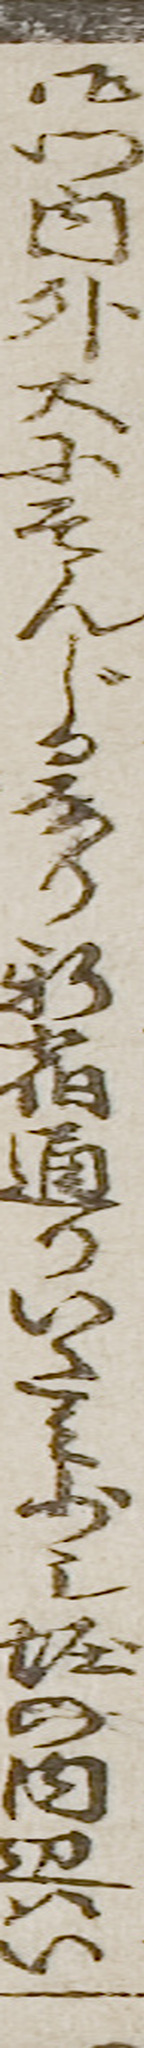御門内外大にそんじるなり新宿通りいたみ少シ堀の内辺はい
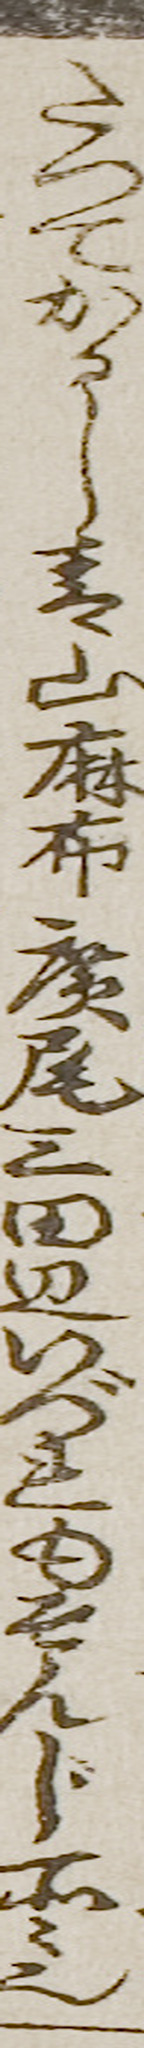たつてかるし青山麻布広尾三田辺いづれもそんじ所々也
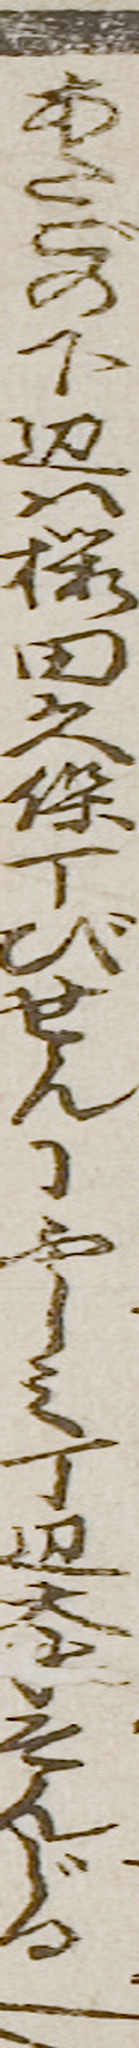あたごの下辺は桜田久保丁びせん丁ふしみ丁辺大半そんじる
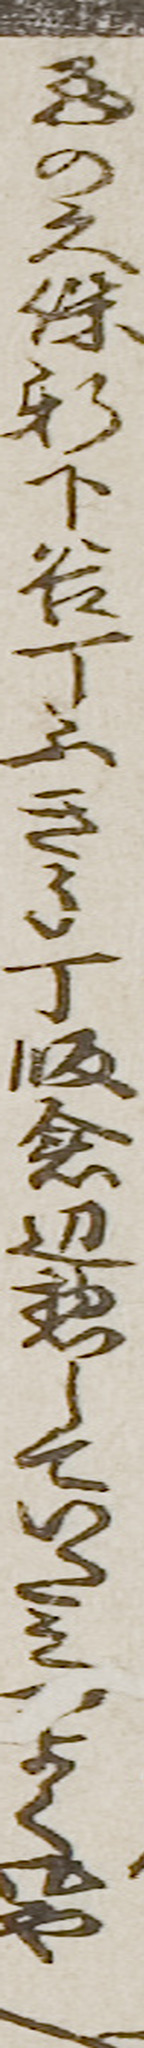西の久保新下谷丁ふき手丁飯倉辺惣していたみつよく御や
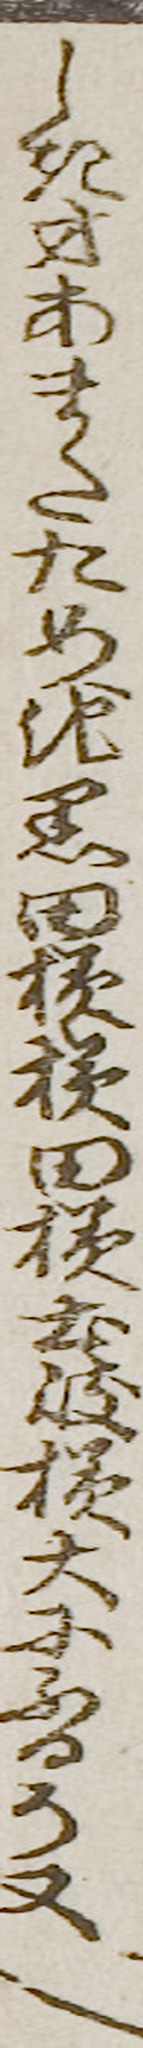しき方あまたため池黒田様様田様土岐様大にふるう又
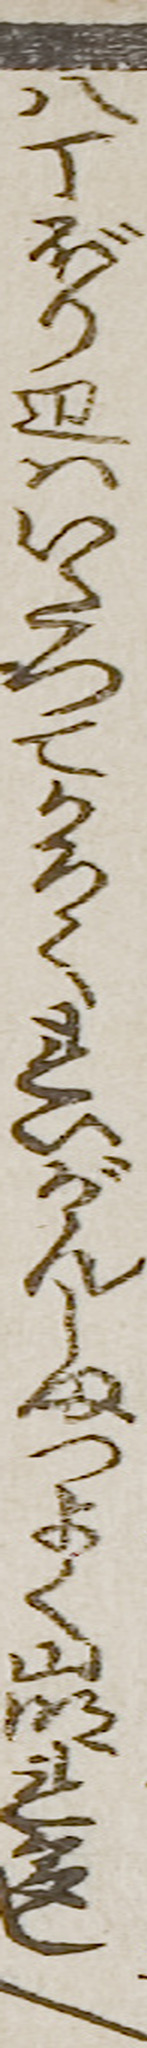八丁ぼり辺はいたつてかろくれいがんしまつよく崩れ多し
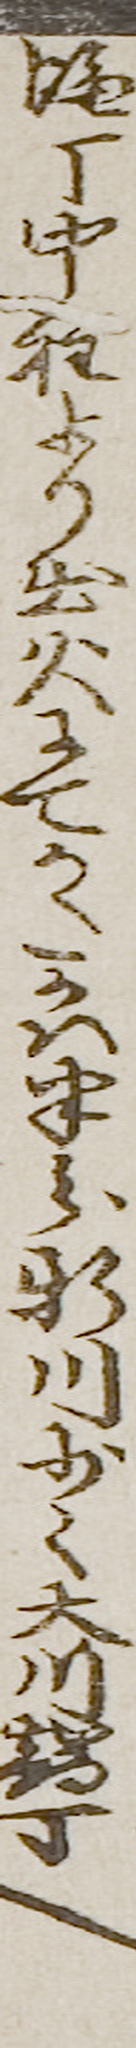塩丁中程より出火にてかたかは半分新川少々大川端丁
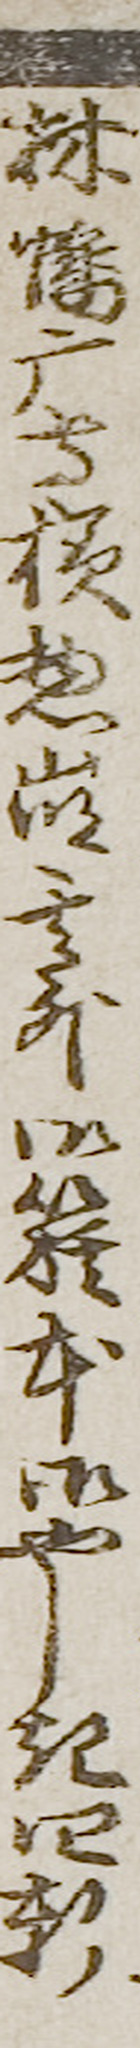林播磨守様惣崩其外御旗本御やしき四軒
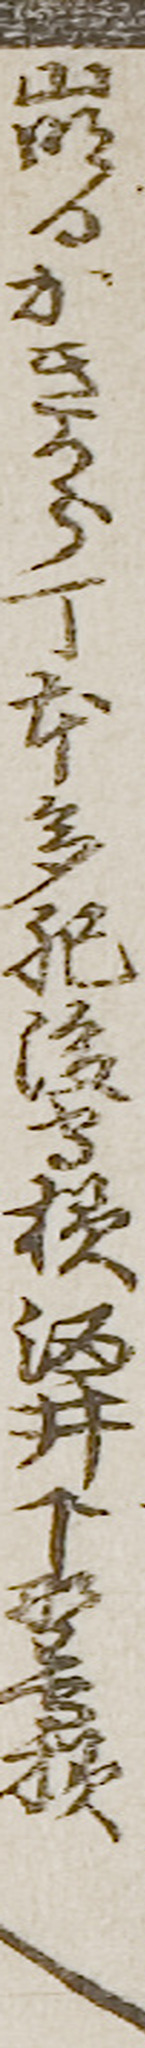崩るかきから丁本多肥後守様酒井下野守様
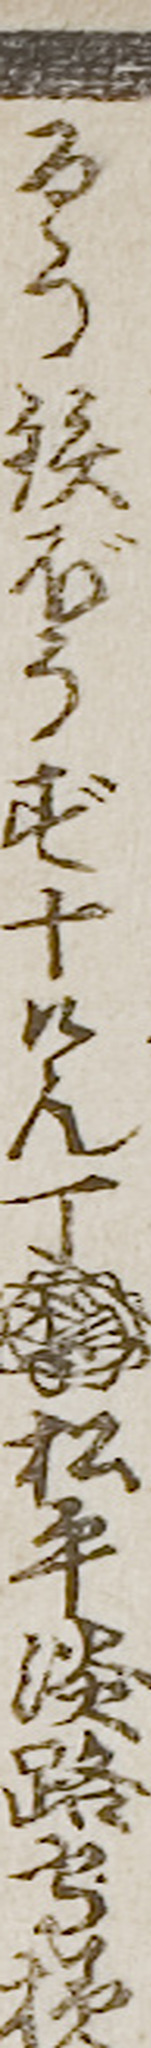るう鉄ぼうず十けん丁〇松平淡路守様
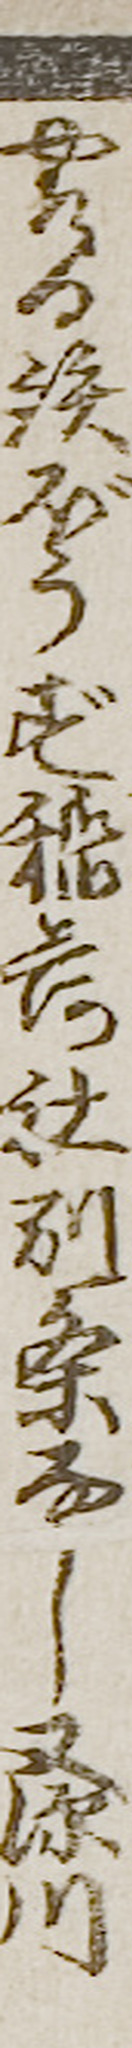やける鉄ぼうず稲荷社別条なし又深川
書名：安政改正泰平盤石図会
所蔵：東京大学総合図書館 General Library in the University of Tokyo, JAPAN
